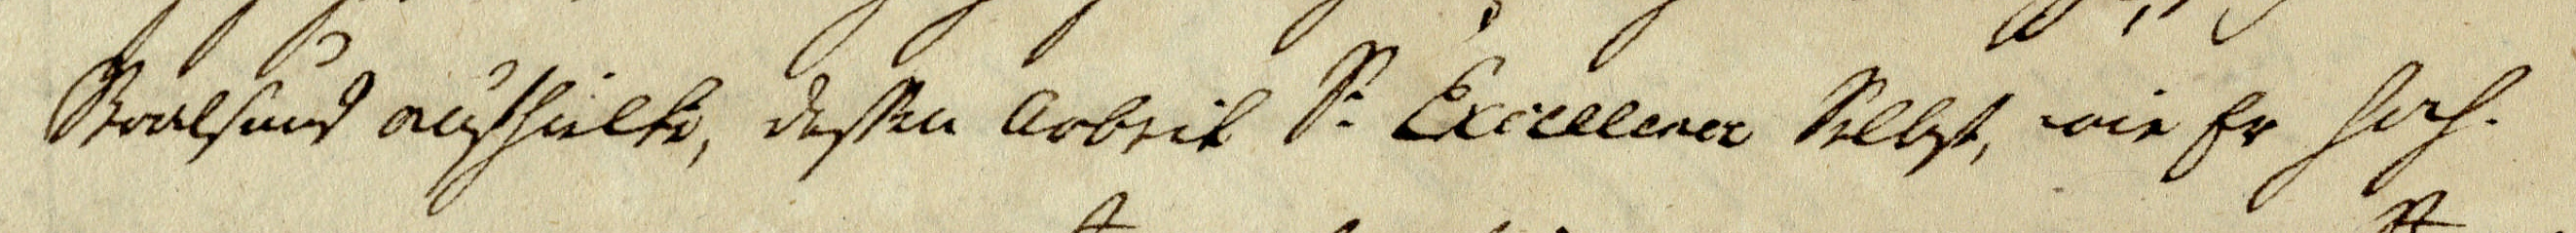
Stralsund aufhielte, dessen Arbeit Sr. Excellence Selbst, wie Er hoch¬
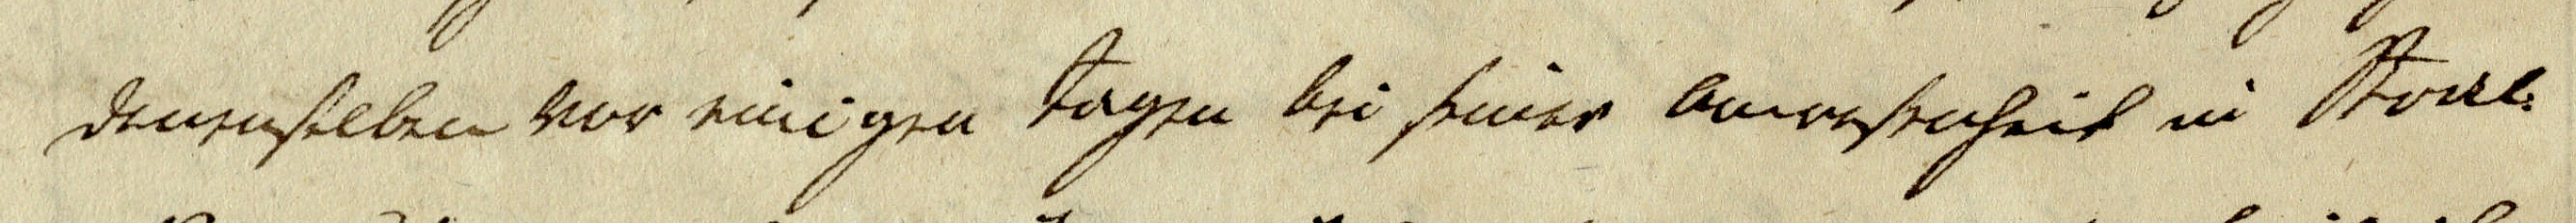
denenselben vor einigen Tagen bei seiner Anwesenheit in Stral¬
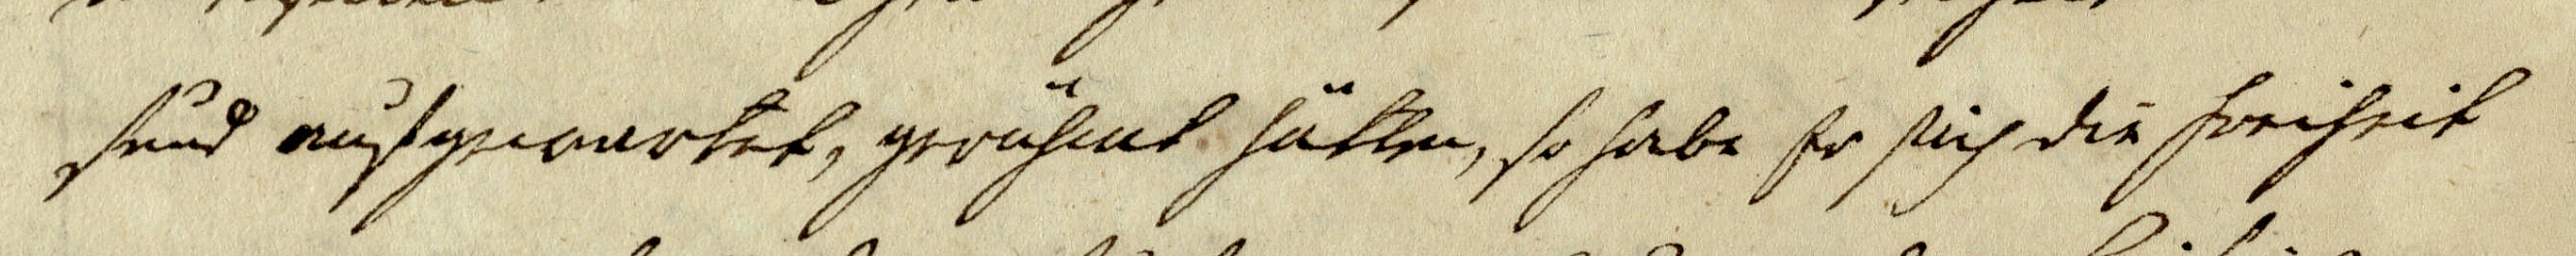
sund aufgewartet, gerühmt hätten, so habe Er sich die Freiheit
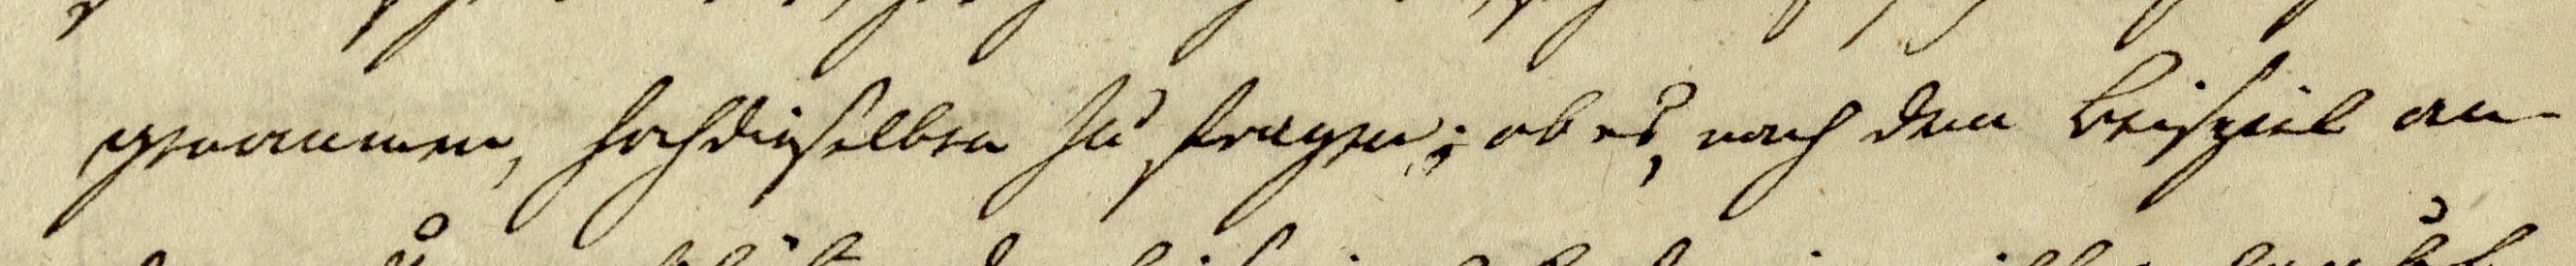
genommen, hochdieselben zu fragen: ob es, nach dem Beispiel an¬
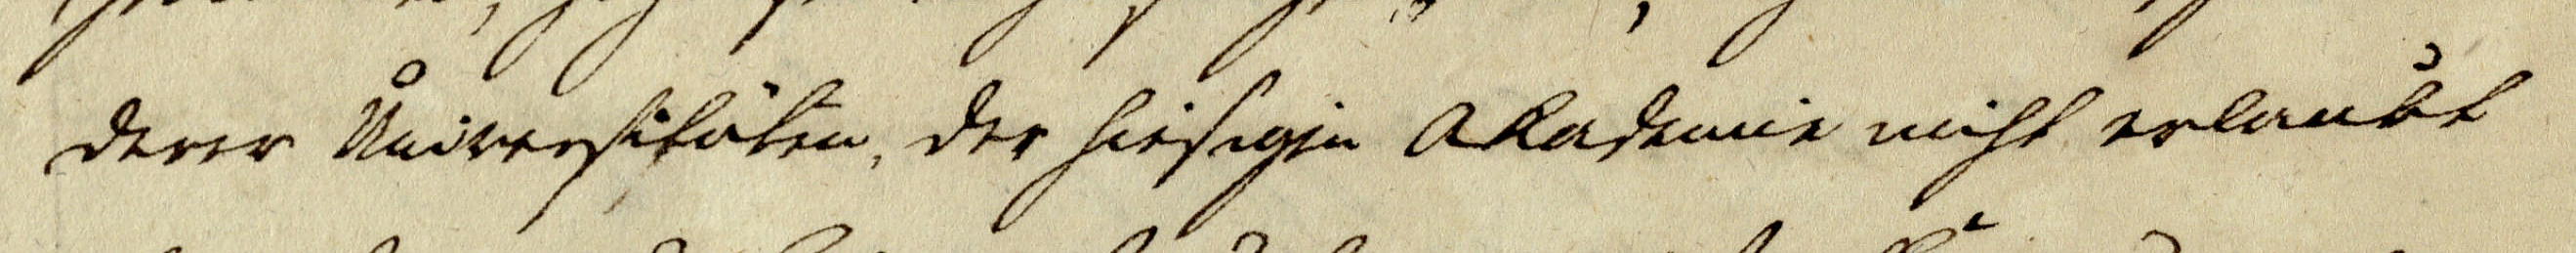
derer Universitäten, der hiesigen Akademie nicht erlaubt
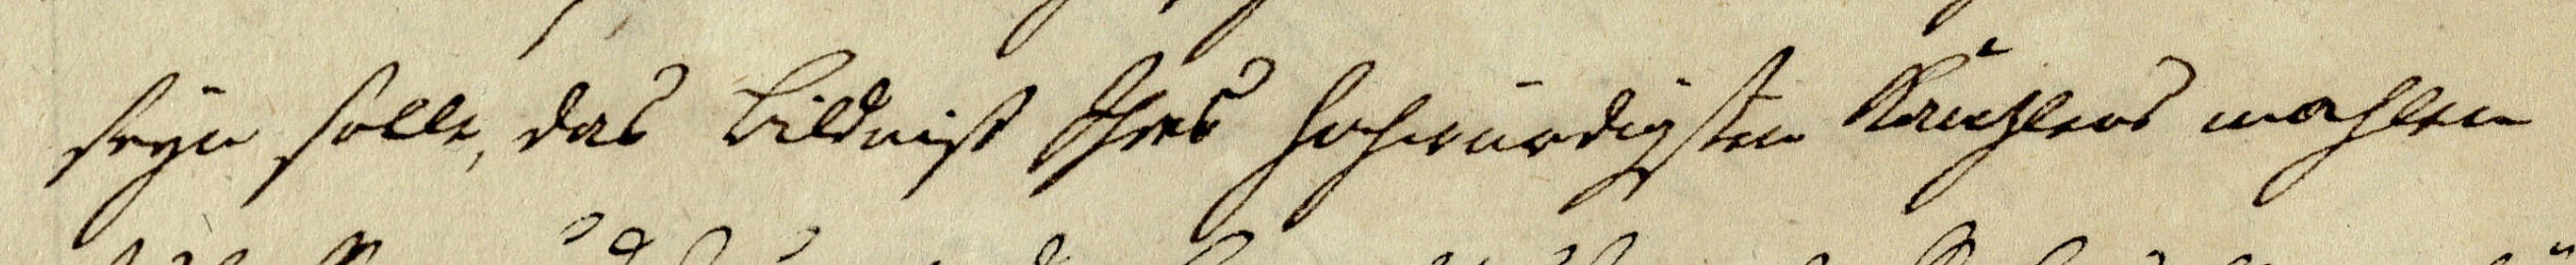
seÿn solle, das Bildniß Ihres hohwürdigsten Kanzlers mahlen
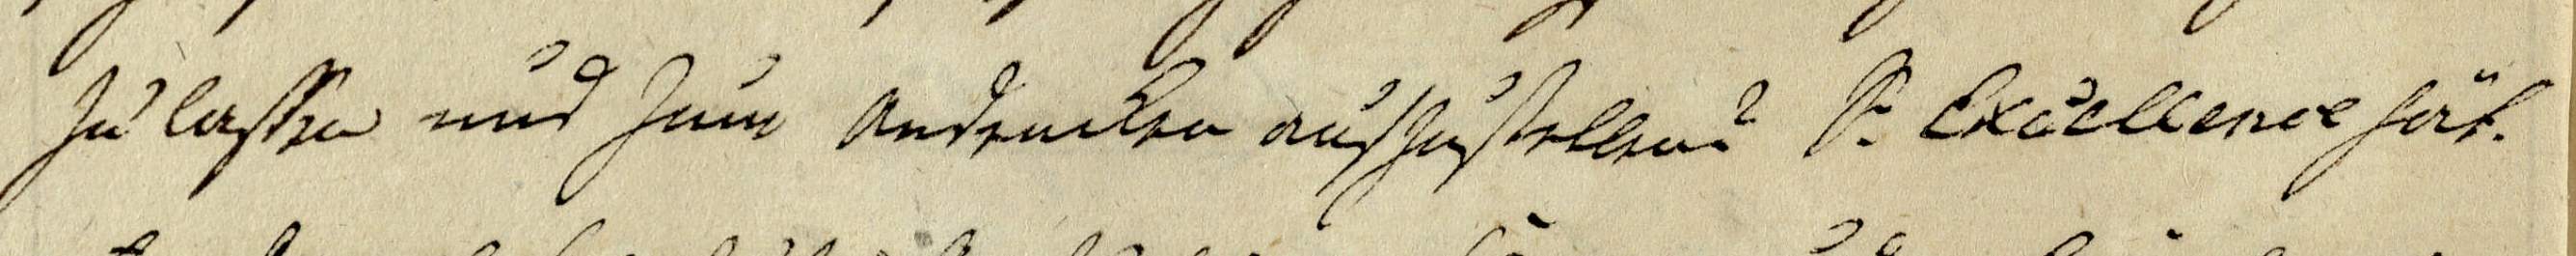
zu lassen und zum Andencken aufzustellen? Sr. Excellence hät¬
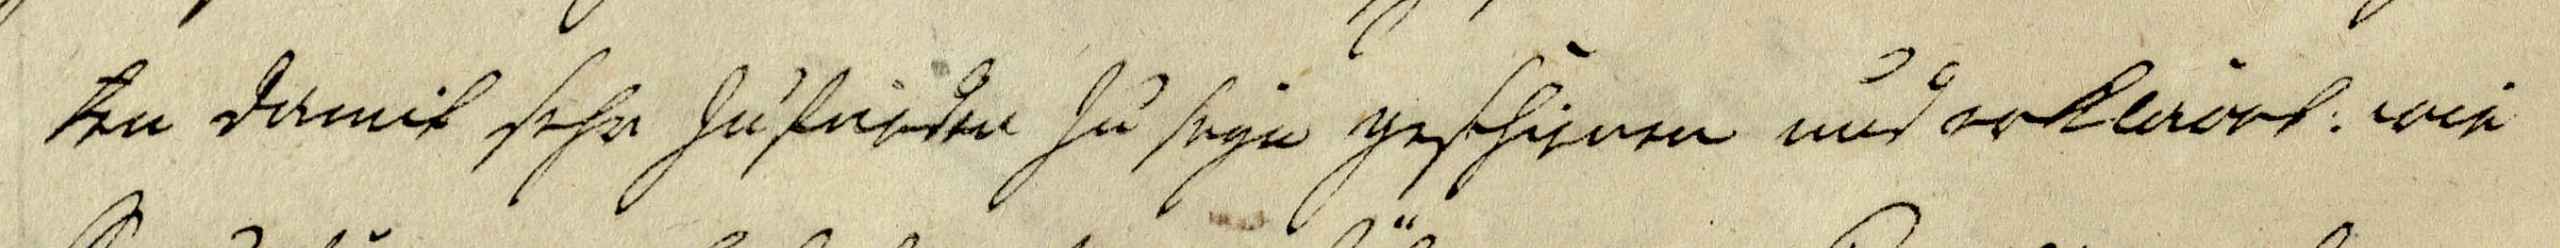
ten damit sehr zufrieden zu seÿn geschienen und erklärt: wie
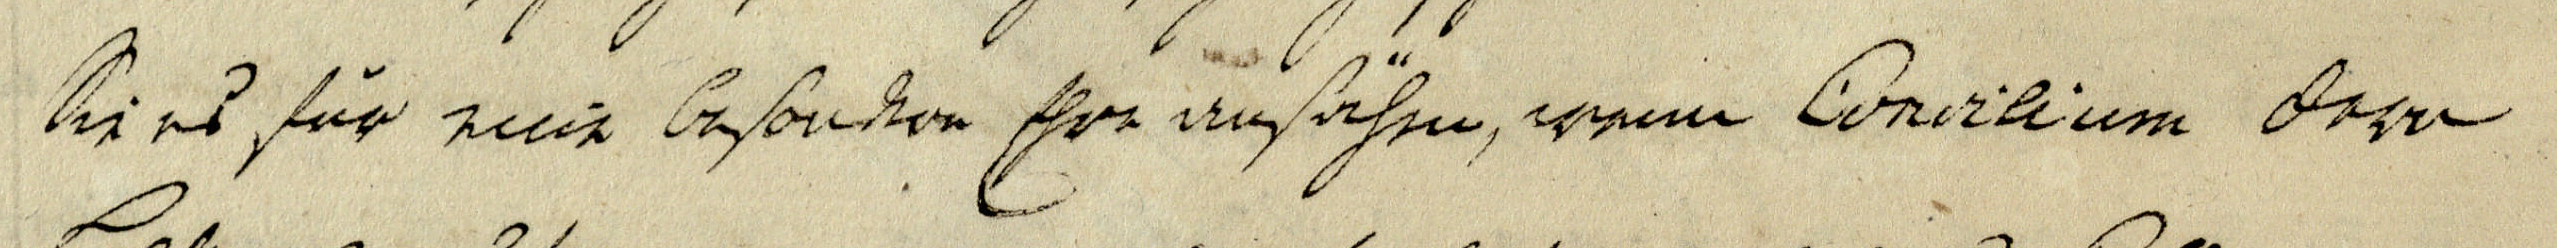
Sie es für eine besondere Ehre ansähen, wenn Concilium Dero
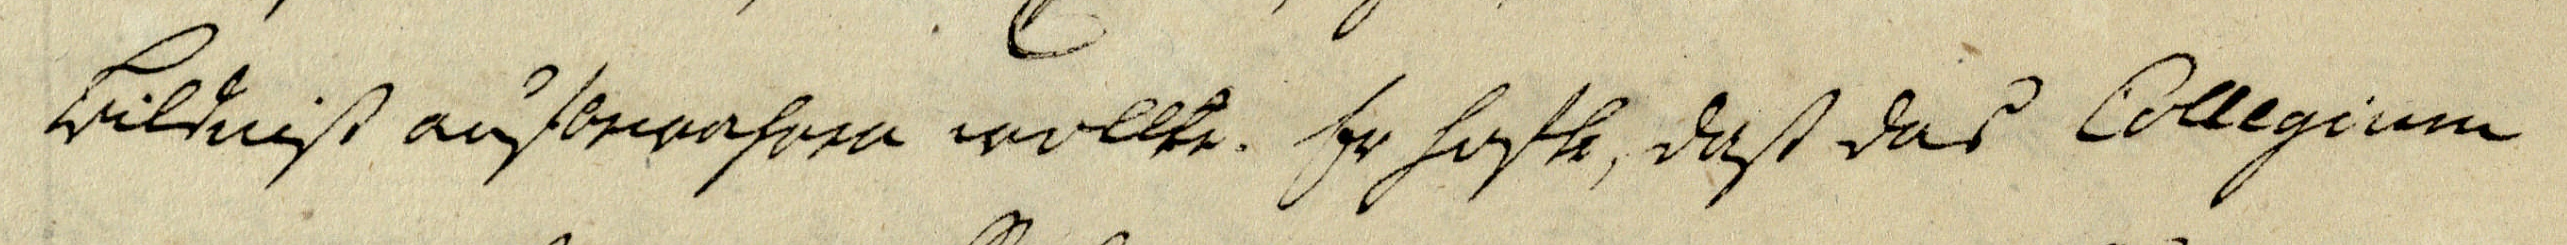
Bildniß aufbewahrten wollte. Er hofte, daß das Collegium
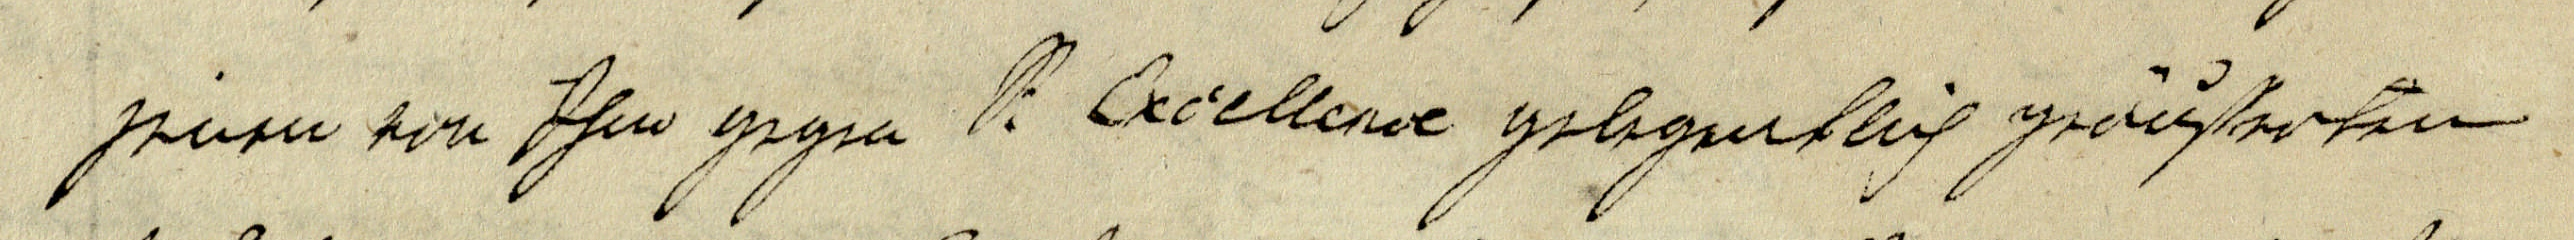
jenen von Ihm gegen Sr Excellence gelegentlich geäusserten
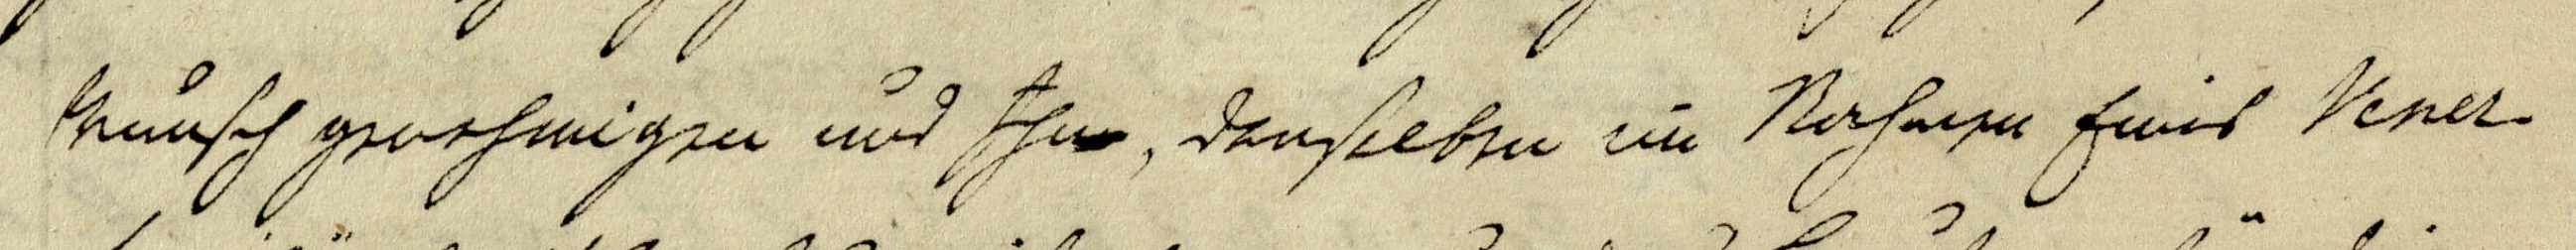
Wunsch genehmigen und Ihn, denselben im Nahmen Eines Vener.
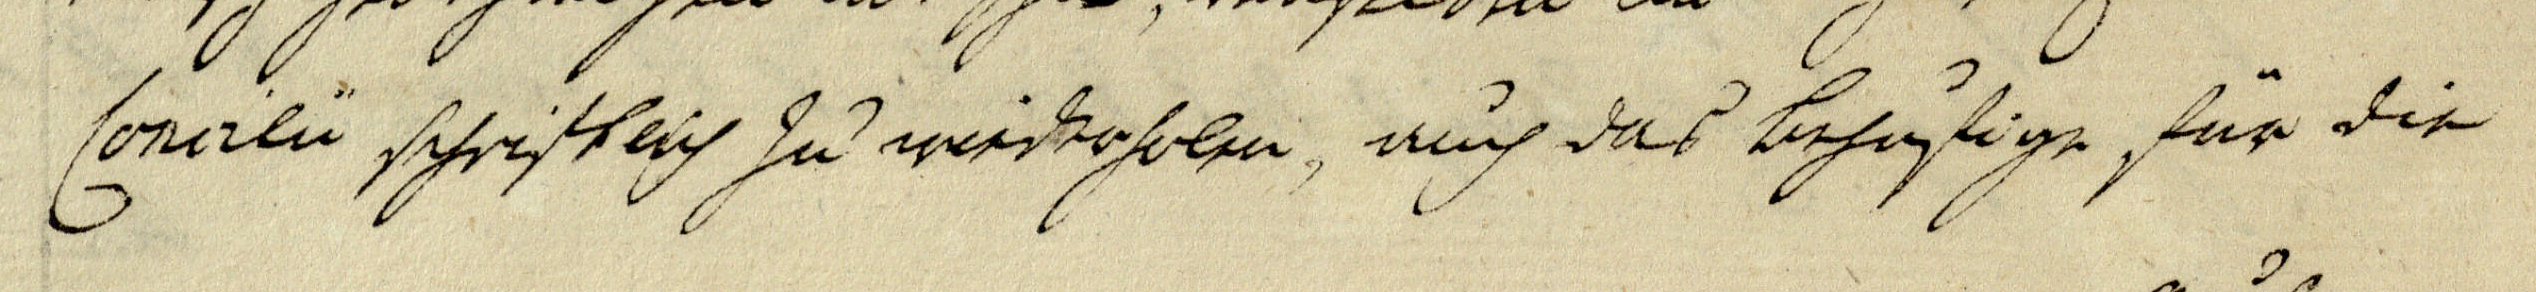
Concilii schriftlich zu wiederholen, auch das Behufige für die
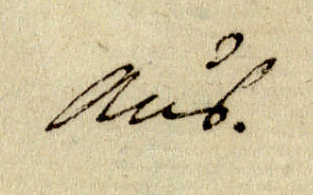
Aus
